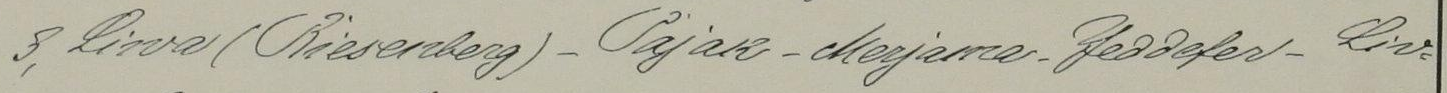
3. Liwa (Riesenberg)-Pajak-Merjama-Jeddefer-Liv-
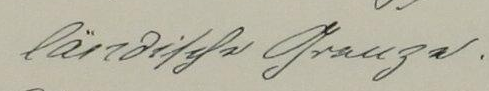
ländische Grenze.
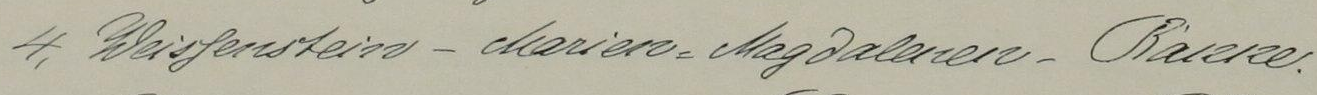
4. Weissenstein–Marien-Magdalenen–Rakke.
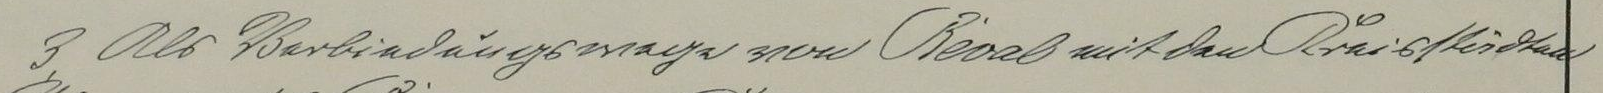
3. Als Verbindungswege von Reval mit den Kreisstädten
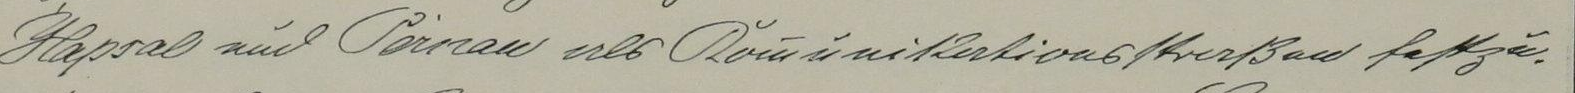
Hapsal und Pernau als Kommunikationsstraßen festzu-
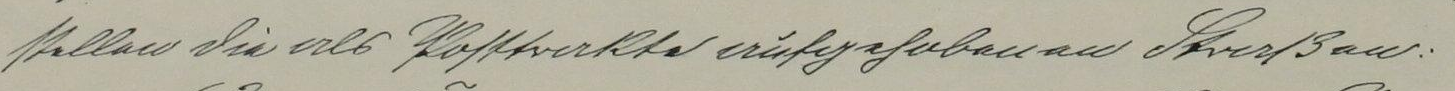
stellen die als Posttrakte aufgehobenen Straßen:
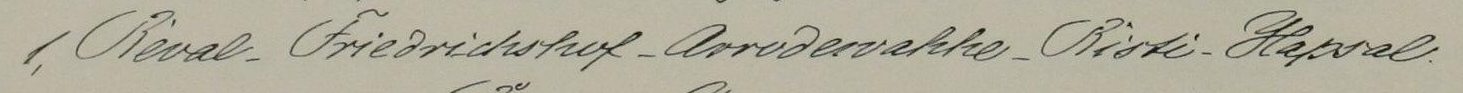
1. Reval-Friedrichshof-Arrrodewahhe-Risti-Hapsal
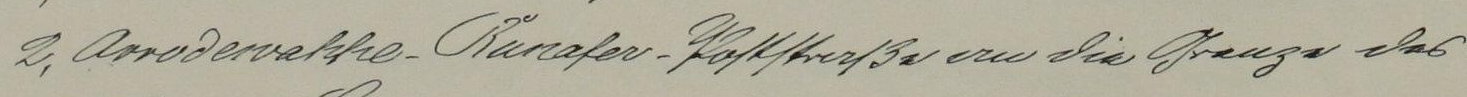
2. Arrodewahhe-Runafer-Poststraße an die Grenze des
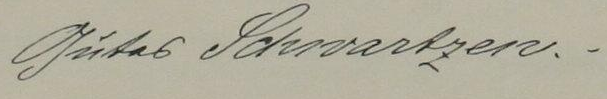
Gutes Schwartzen.
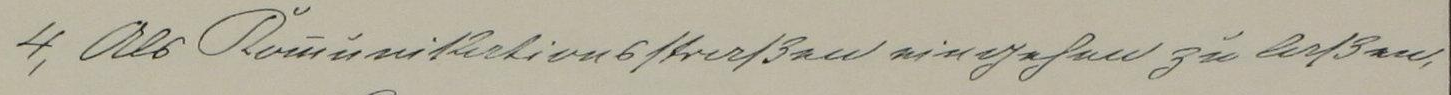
4. Als Kommuunikationsstraßen eingehen zu laßen,
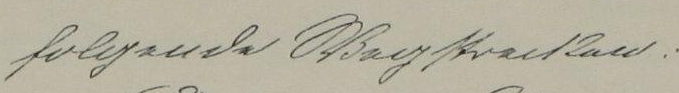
folgende Wegstrecken:
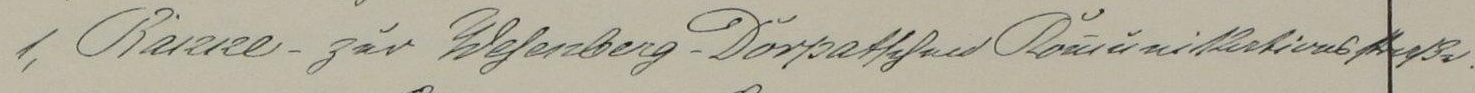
1. Rakke-zur Wesenberg-Dorpatschen Kommunikationsstraße
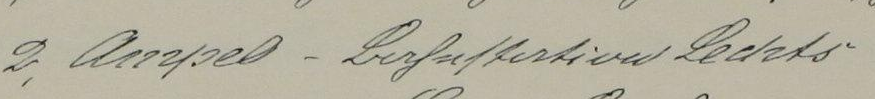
2. Ampel-Bahnstation Lechts
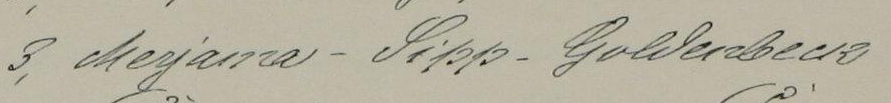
3. Merjama-Sipp-Goldenbeck
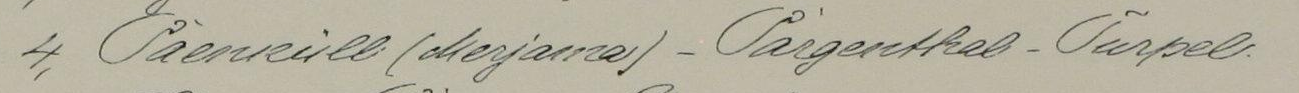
4. Paenküll (Merjama)-Pargenthal-Turpel
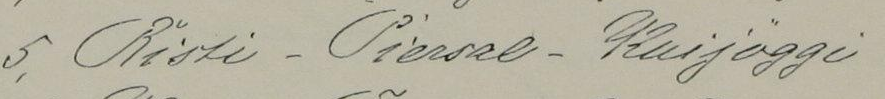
5. Risti-Piersal-Kuijöggi
